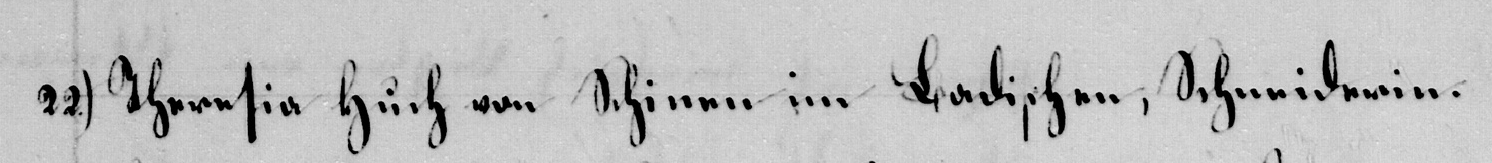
22.) Theresia Huch von Schinen im Badischen, Schneiderin.
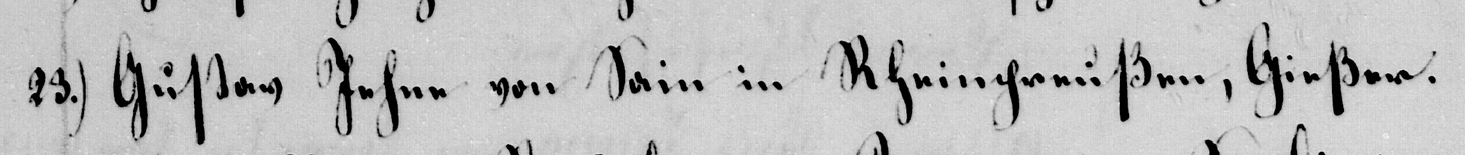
23.) Gustav Inhen von Sain in Rheinpreußen, Gießer.
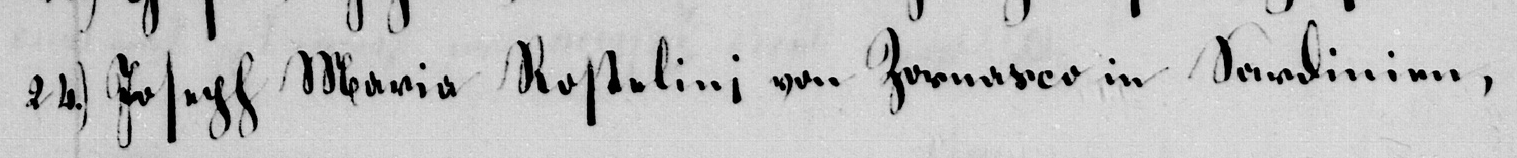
24.) Joseph Maria Rostelini von Zornasco in Sardinien,
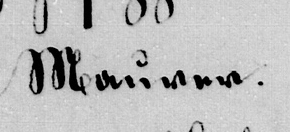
Maurer.
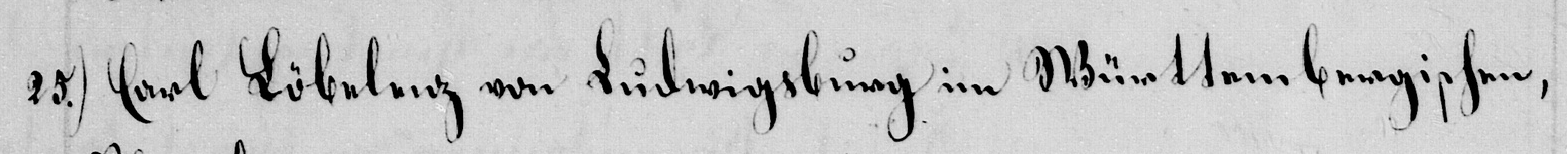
25.) Carl Löbelenz von Ludwigsburg im Württembergischen,
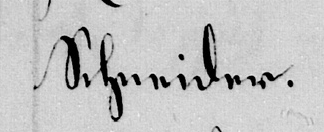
Schneider.
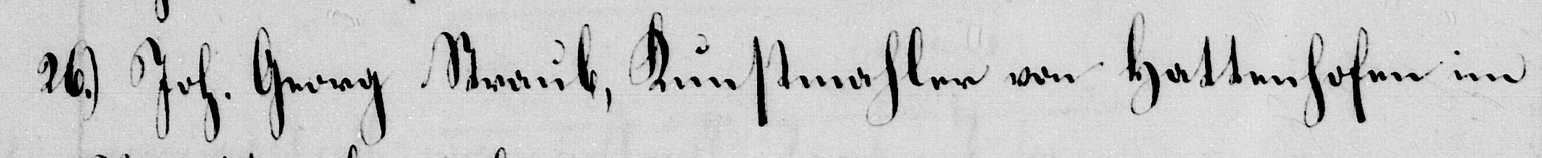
26.) Joh. Georg Straub, Kunstmahler von Hettenhofen im
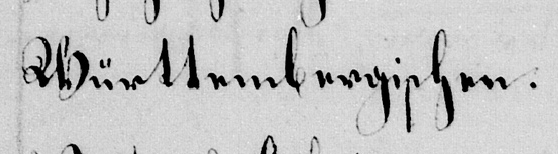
Württembergischen.
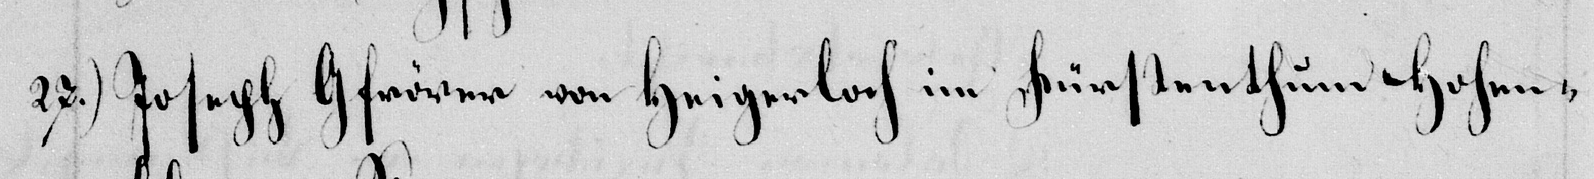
27.) Joseph Gfrörer von Heigerloch im Fürstenthum Hohen¬
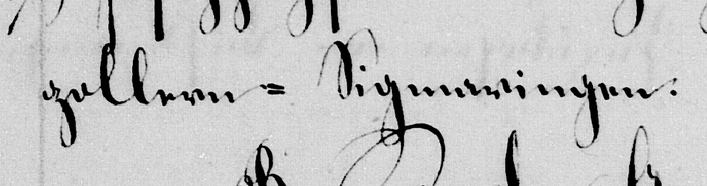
zollern-Sigmaringen.
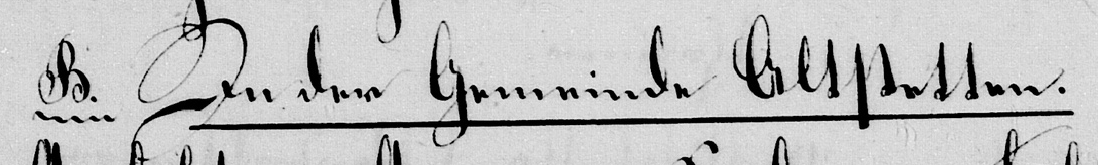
B. In der Gemende Altstetten.
